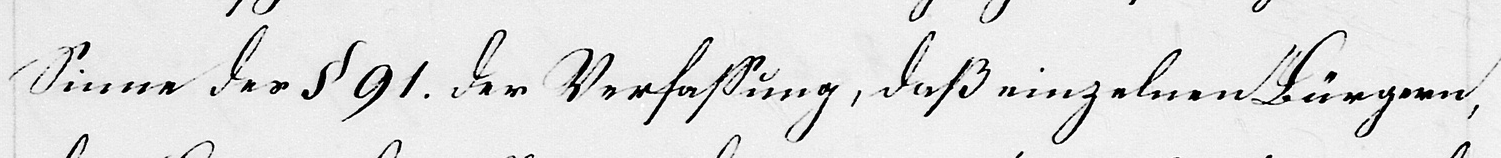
Sinne des § 91. der Verfaßung, daß einzelnen Bürgern,
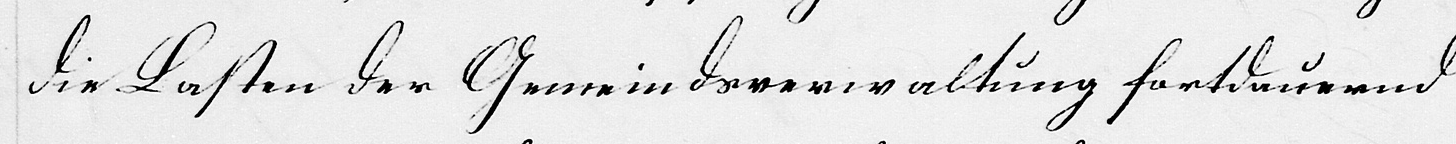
die Lasten der Gemeindsverwaltung fortdauernd
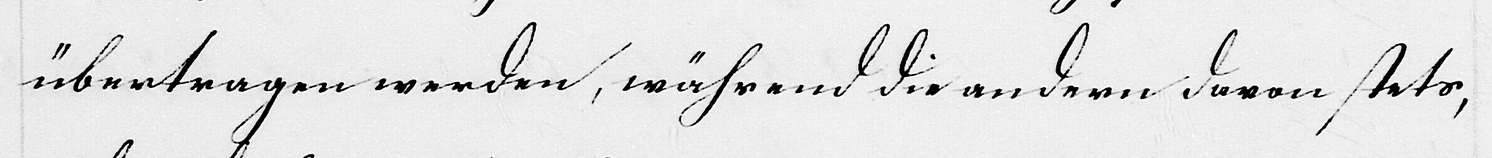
übertragen werden, während die andern davon stets,
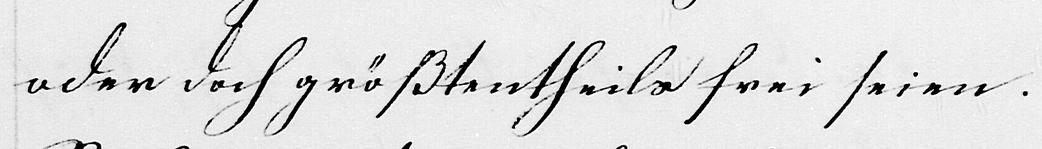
oder doch größtentheils frei seien.
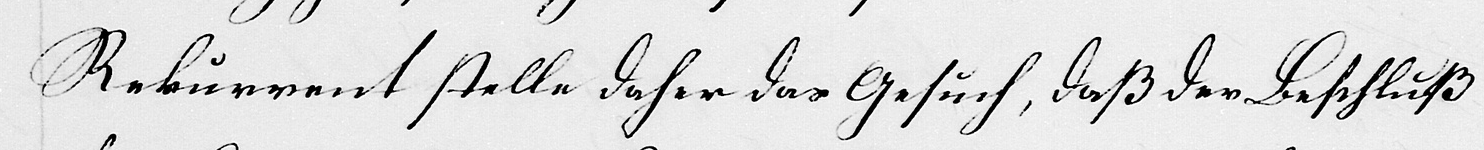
Rekurrent stelle daher das Gesuch, daß der Beschluß
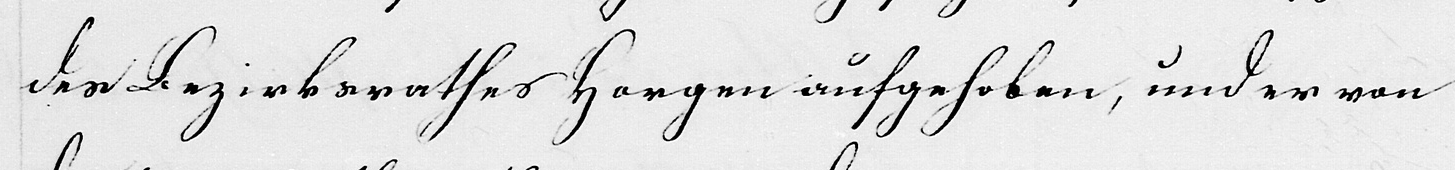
des Bezirksrathes Horgen aufgehoben, und er von
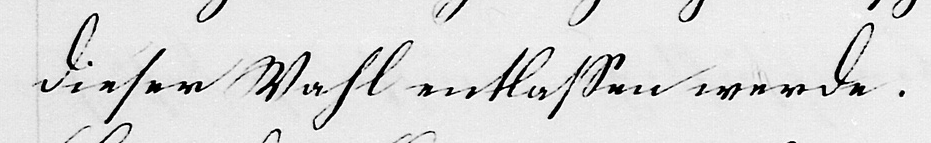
dieser Wahl entlaßen werde.
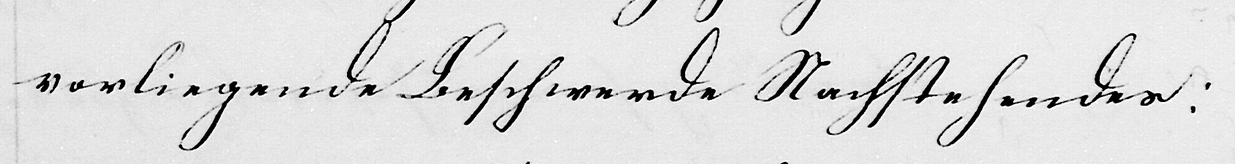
vorliegende Beschwerde Nachstehendes:
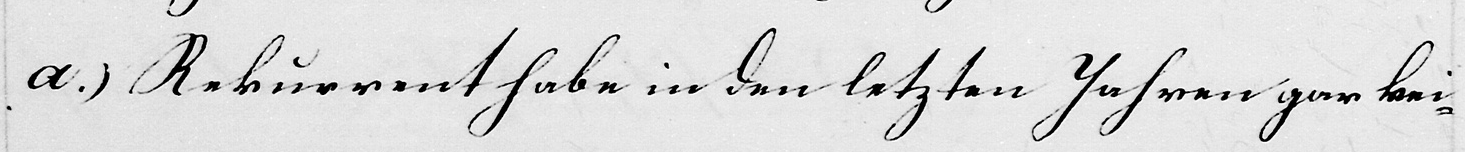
a.) Rekurrent habe in den letzten Jahren gar kei¬
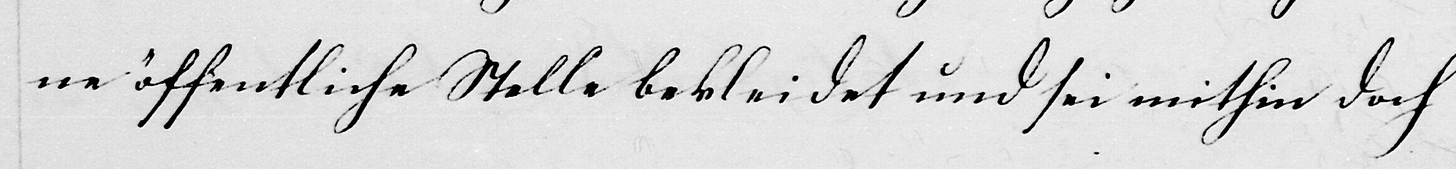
ne öffentliche Stelle bekleidet und sei mithin doch
